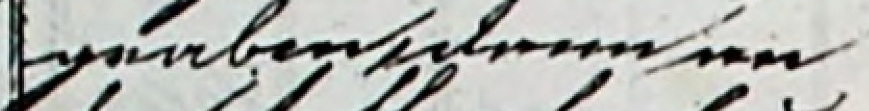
graben, dann an
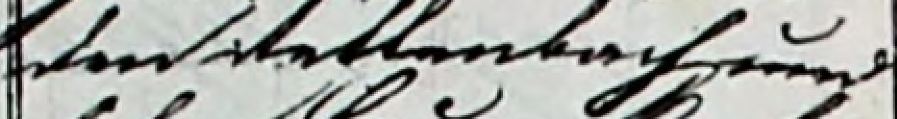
den Rettenbach und
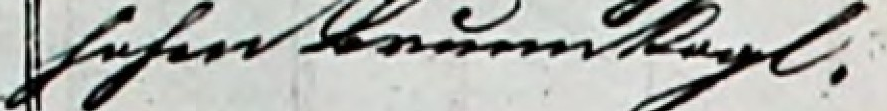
hohen Brunnkogl.
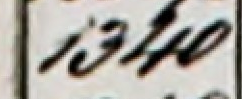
1340
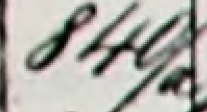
840/a
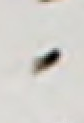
„
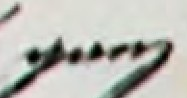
ganz
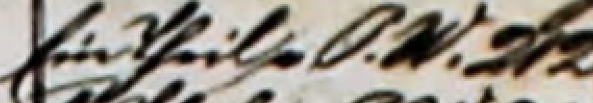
Ein Theil v P.W. 212
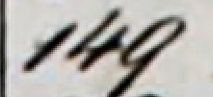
149
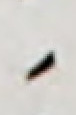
„
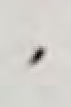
„
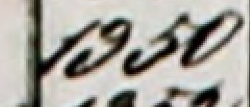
1350
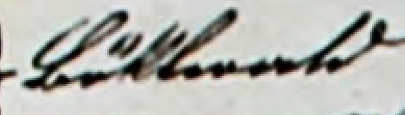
Büklwald
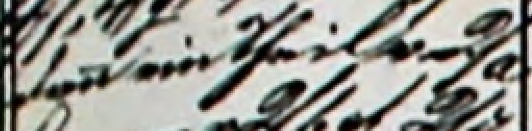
dann ein Theile 2/a
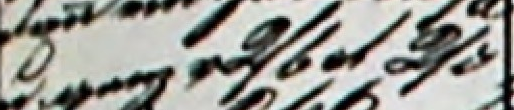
u. ganz v 2/b et 2/c
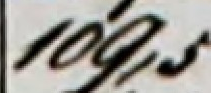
109,5
